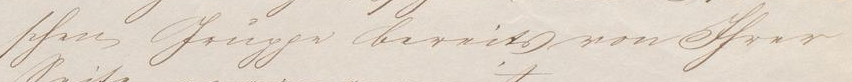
schen Gruppe bereits von Ihrer
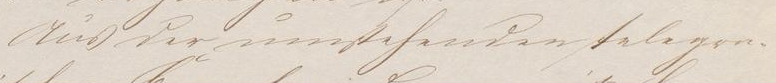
Aus der umstehenden telegra-
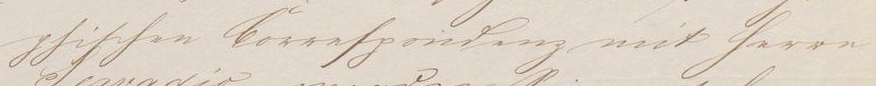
phischen Correspondenz mit Herrn
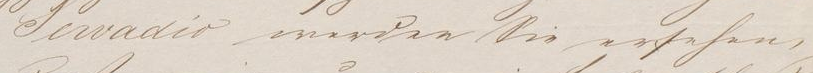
Servadio, werden Sie ersehen,
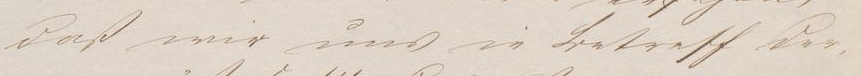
daß wir uns in Betreff der,
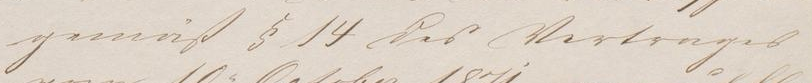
gemäß § 14 des Vertrages
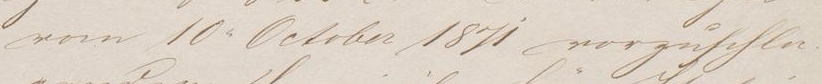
vom 10t October 1871 vorzuschla-
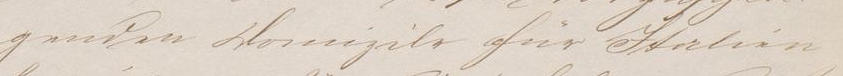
genden Domizile für Italien
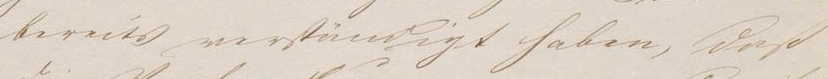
bereits verständigt haben, daß
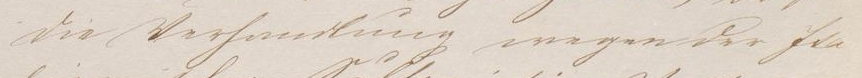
die Verhandlung wegen der Ita-
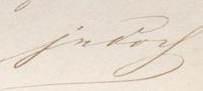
lienischen
